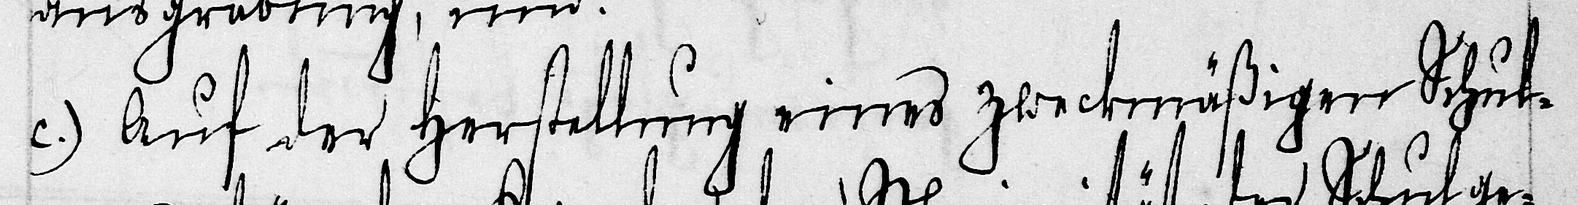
c.) Auf der Herstellung eines zweckmäßigen Schul¬
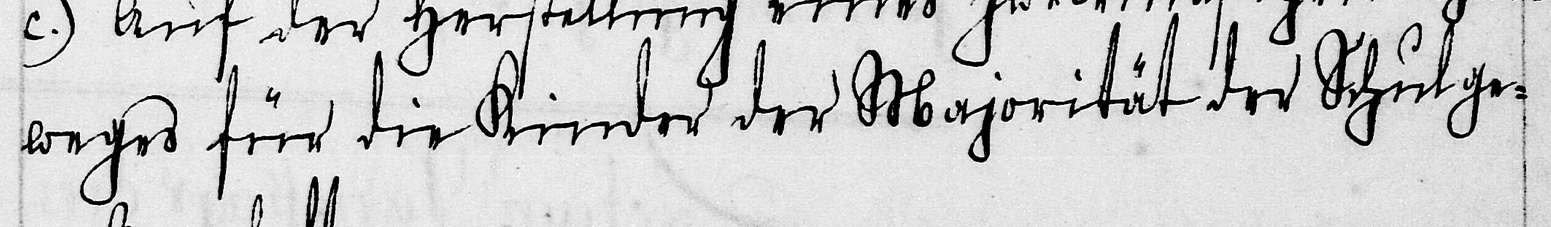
weges für die Kinder der Majorität der Schulge¬
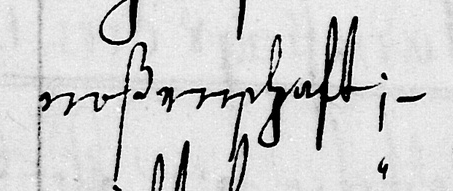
noßenschaft; –
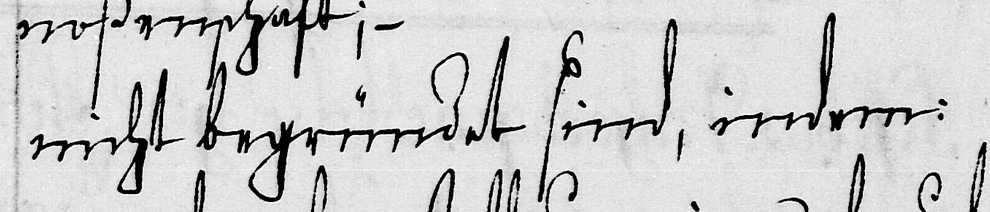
nicht begründet sind, indem:
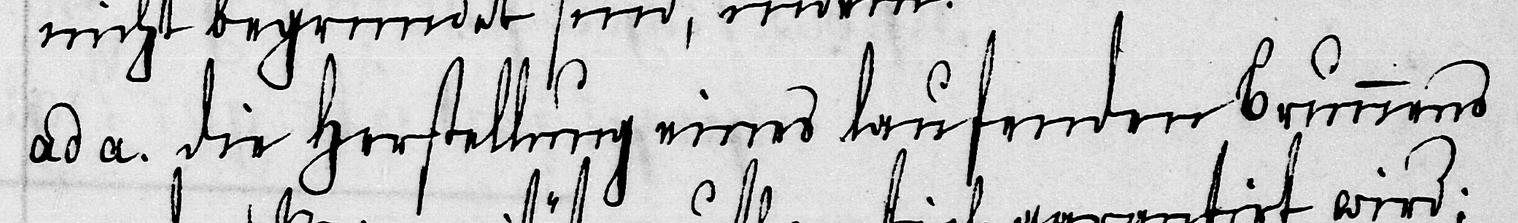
ad a. die Herstellung eines laufenden Brunnens
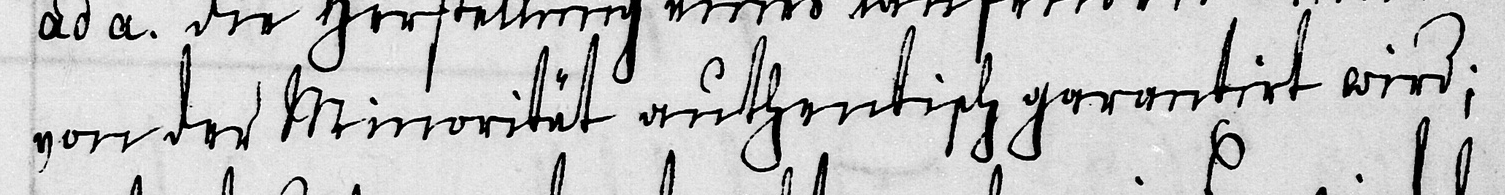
von der Minorität authentisch garantirt wird;
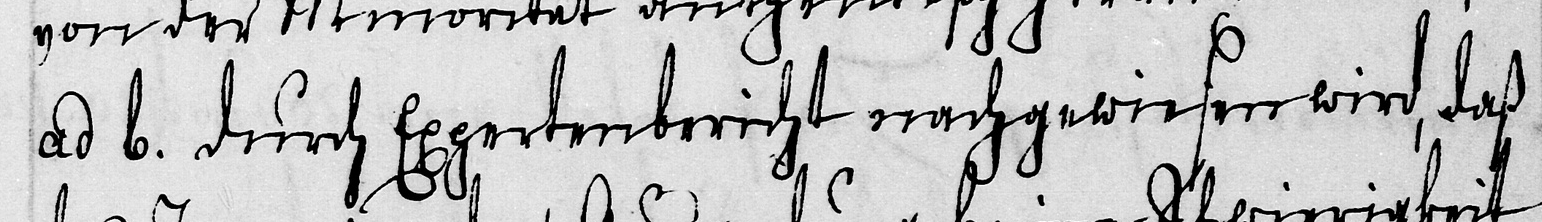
ad b. durch Expertenbericht nachgewiesen wird, daß
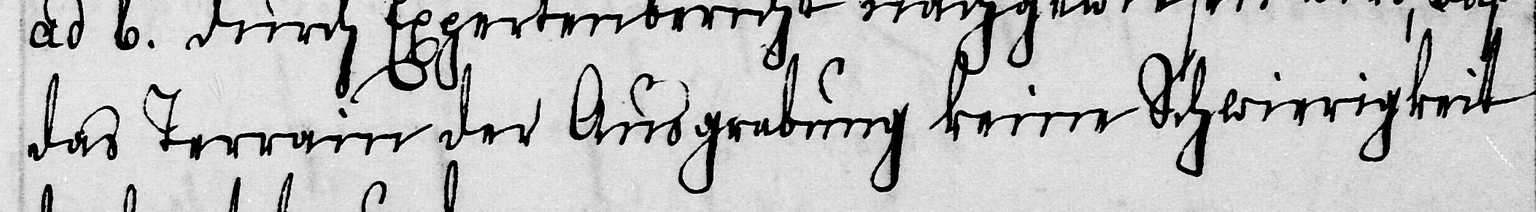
das Terrain der Ausgrabung keine Schwierigkeit
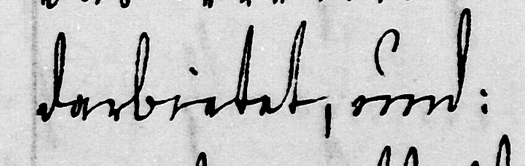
darbietet, und:
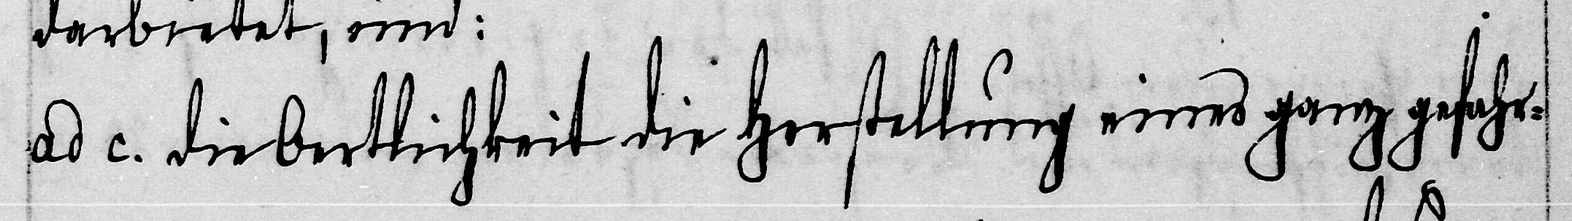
c. die Oertlichkeit die Herstellung eines ganz gefa¬
